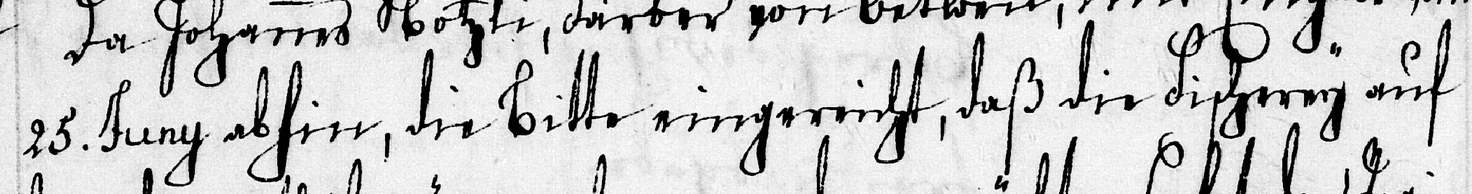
25. Juny abhin, die Bitte eingereicht, daß die Fischerey auf
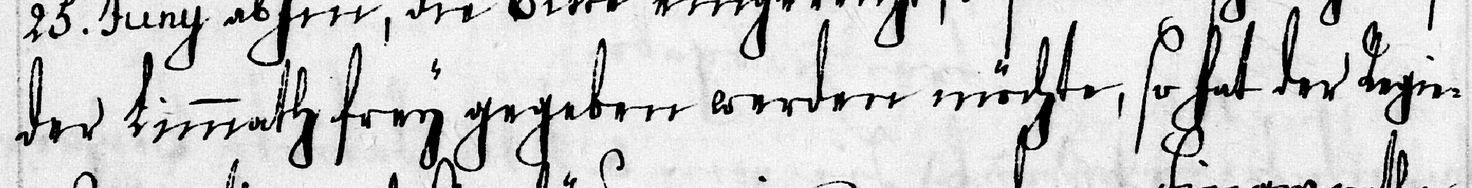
der Limmath frey gegeben werden möchte, so hat der Regi¬
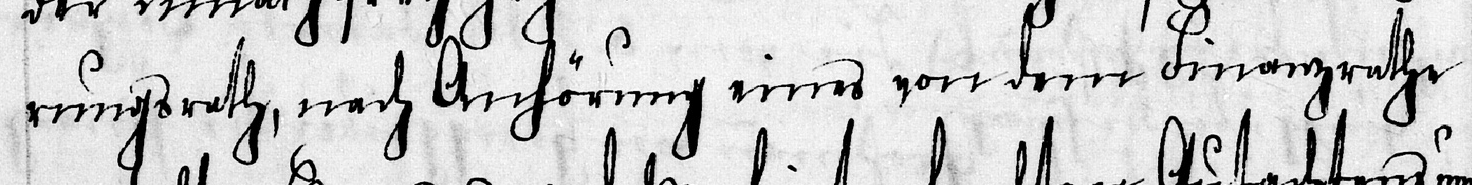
erungsrath, nach Anhörung eines von dem Finanzrathe
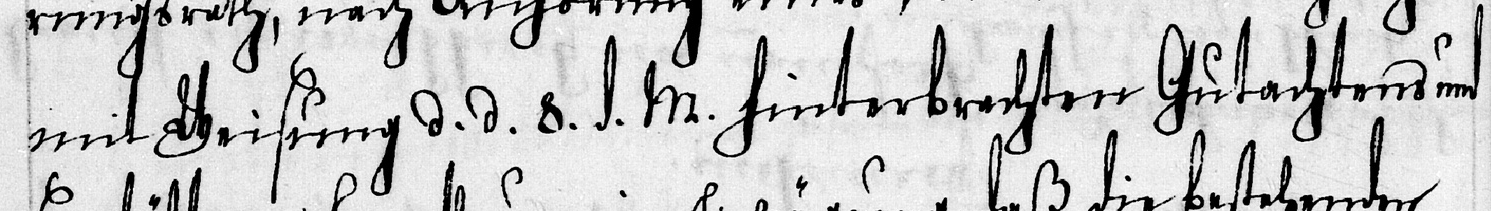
mit Weisung d. d. 8. d. M. hinterbrachten Gutachtens und
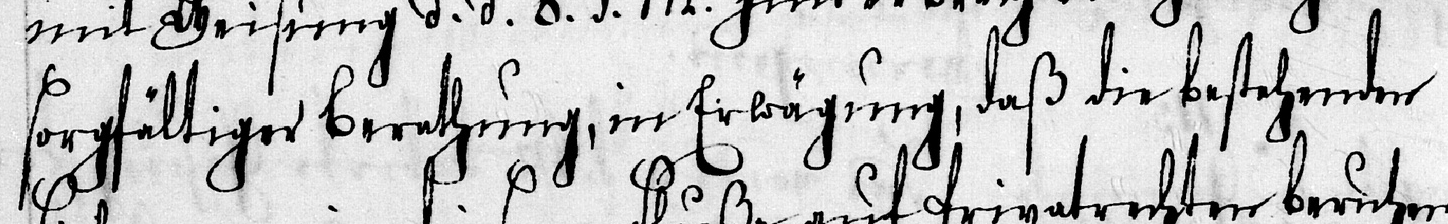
sorgfältiger Berathung, in Erwägung, daß die bestehenden
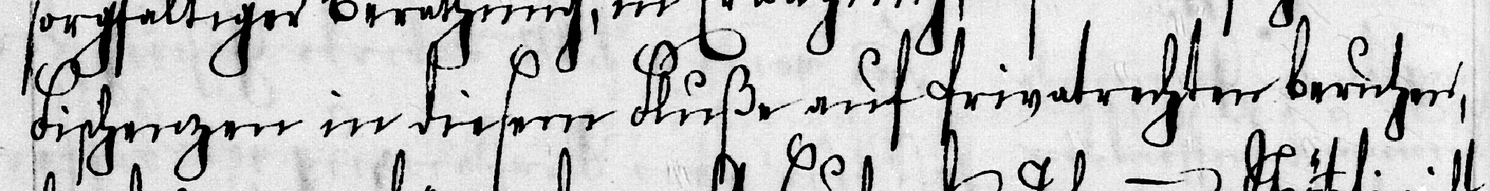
Fischenzen in diesem Fluße auf Privatrechten beruhen,
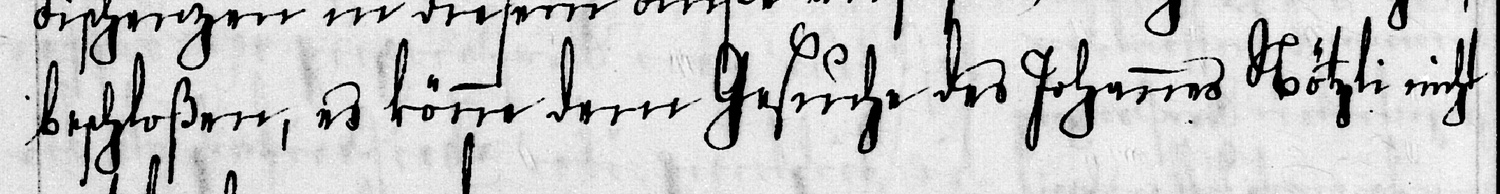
beschloßen, es könne dem Gesuche des Johannes Nötzli nicht
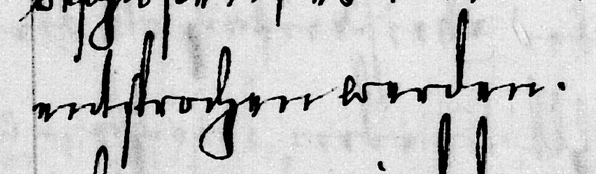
entsprochen werden.
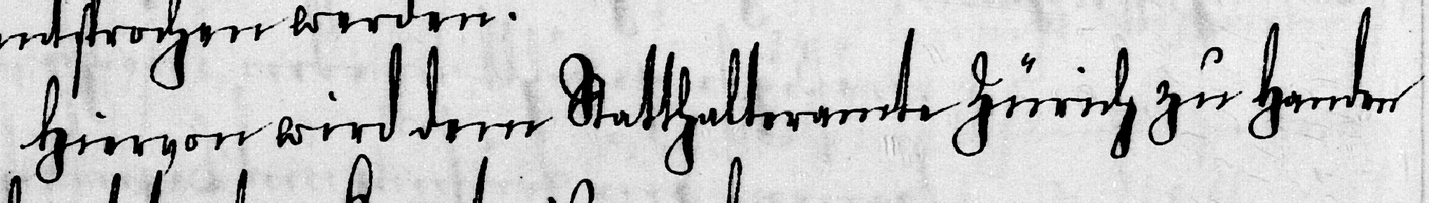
Hiervon wird dem Statthalteramte Zürich zu Handen
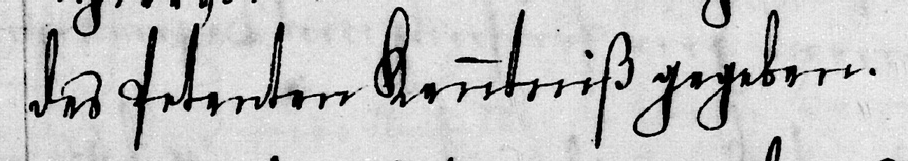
des Petenten Kenntniß gegeben.
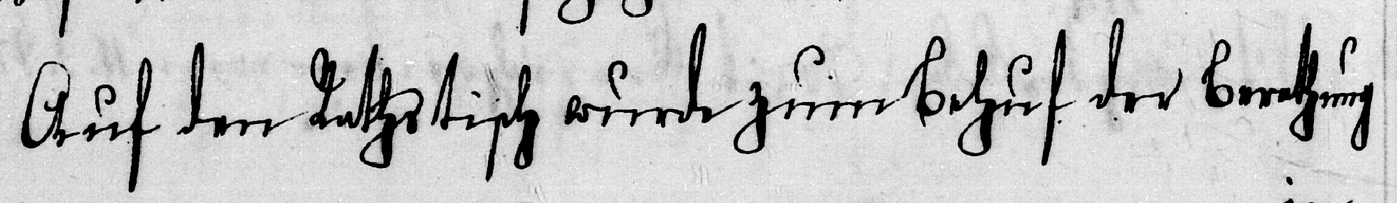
Auf den Rathstsich wurde zum Behuf der Berathung
